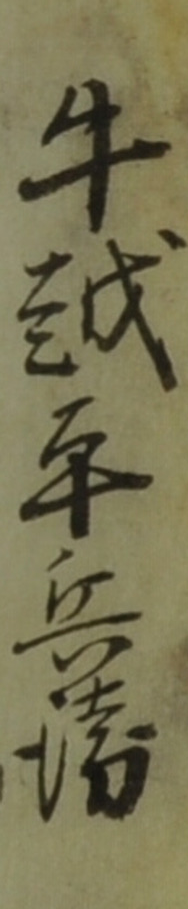牛越平兵衛
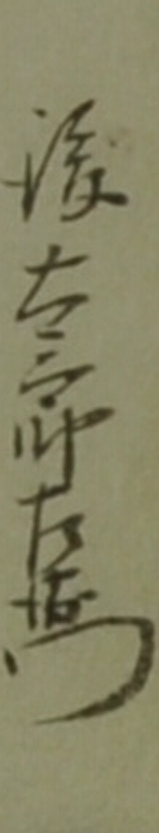後太三郎左衛門
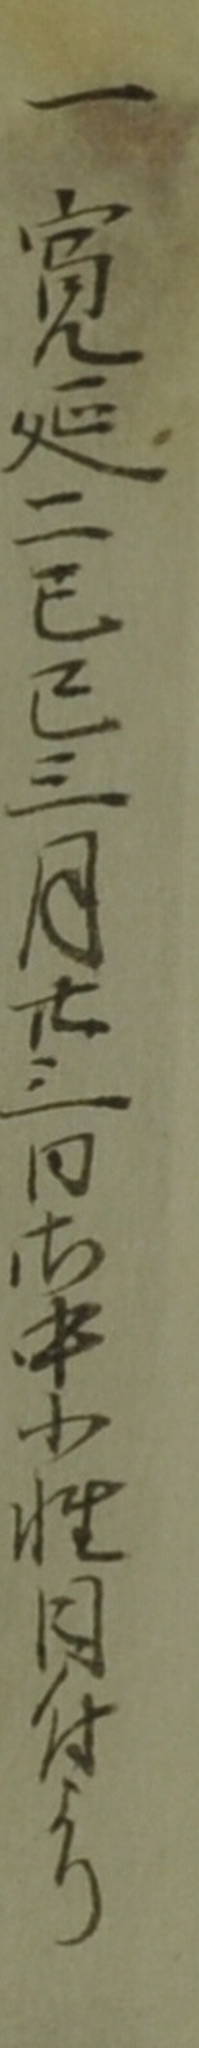一寛延二己巳三月廿三日御中小姓目付より
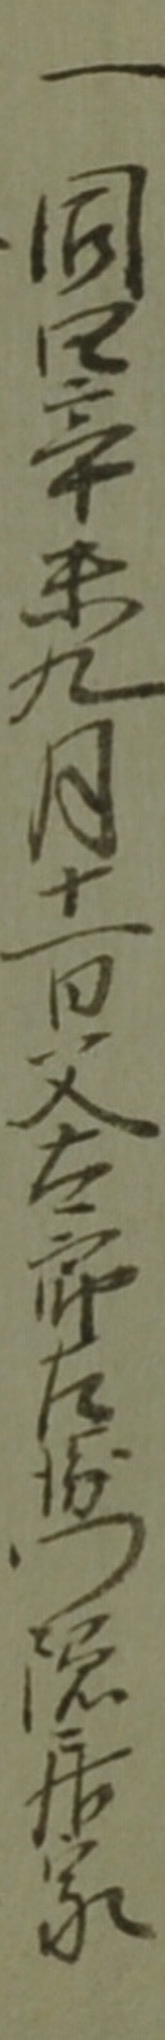一同四辛未九月十一日父太郎左衛門隠居家
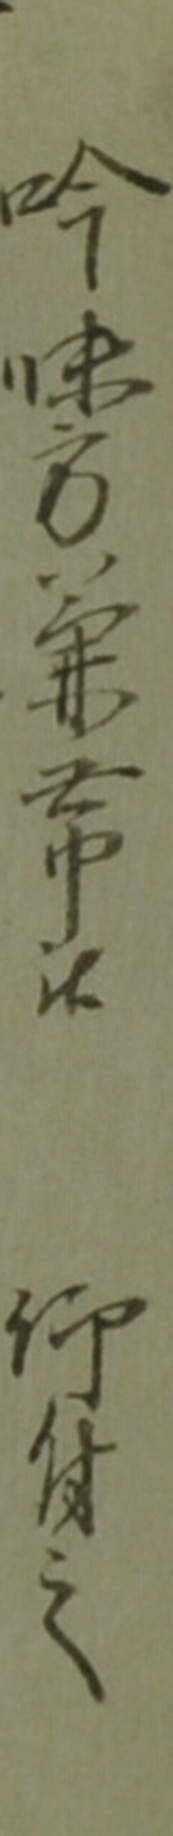吟味方兼帯被仰付之
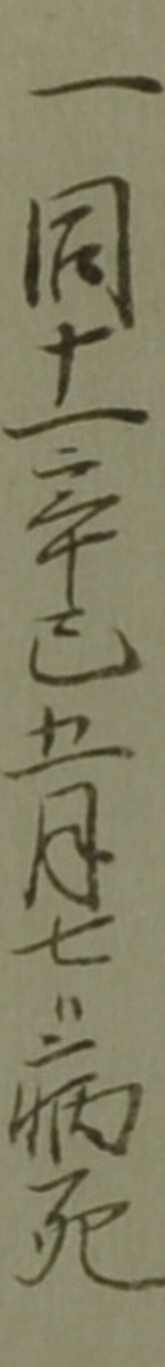一同十一年辛巳五月七日病死
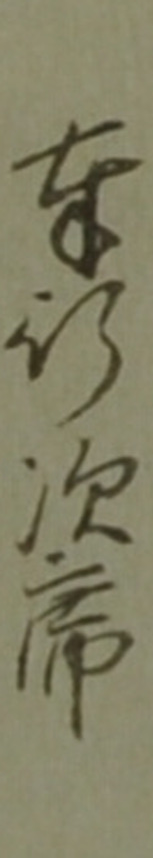奉行次席
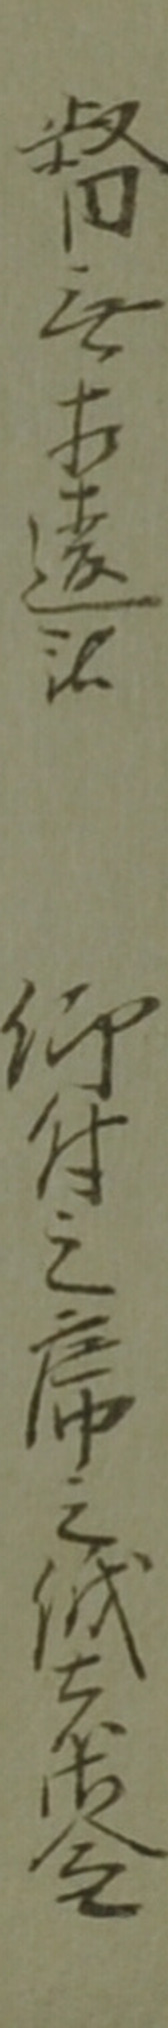督無相違被仰付之席之儀者御金
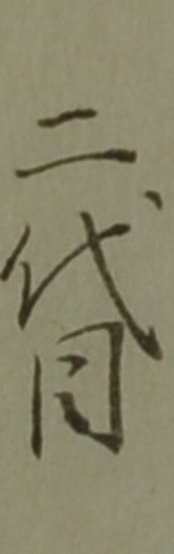二代目
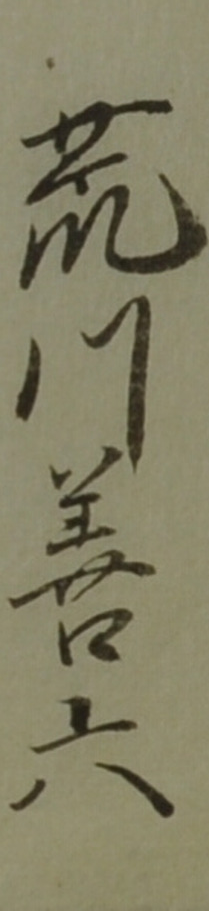荒川善六
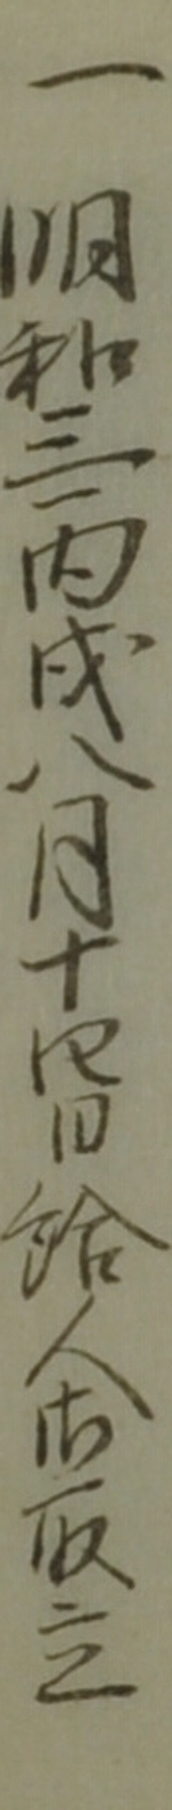一明和三丙戌八月十四日給人御取立
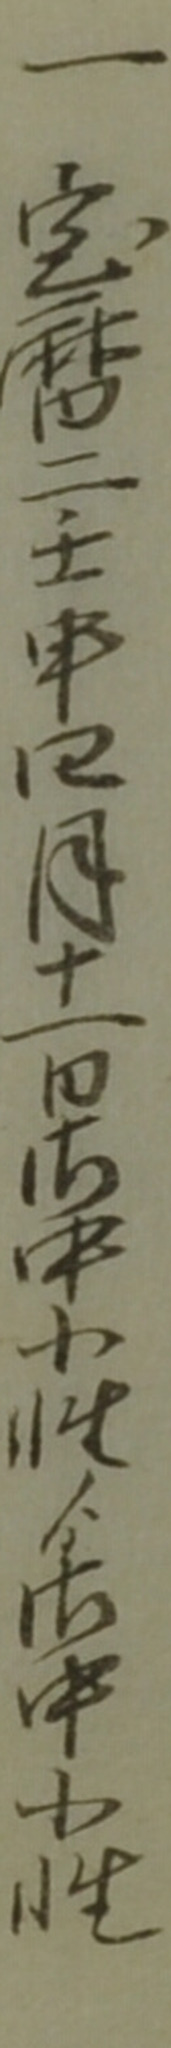一宝暦二壬申四月十一日御中小姓より御中小姓
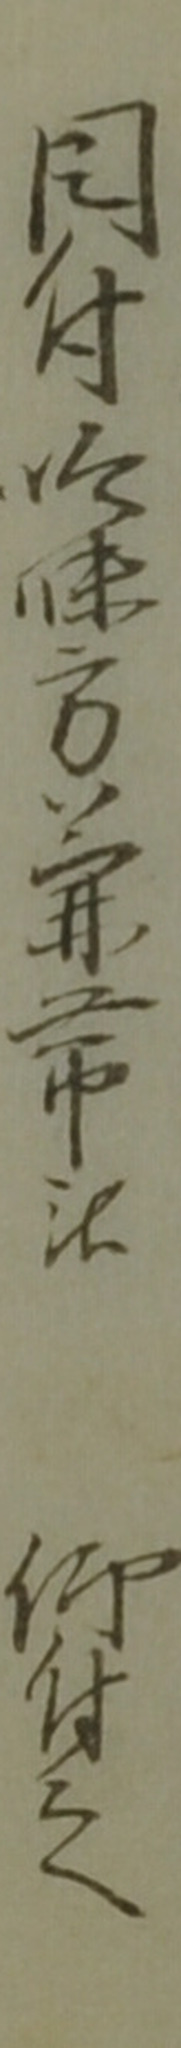目付吟味方兼帯被仰付之
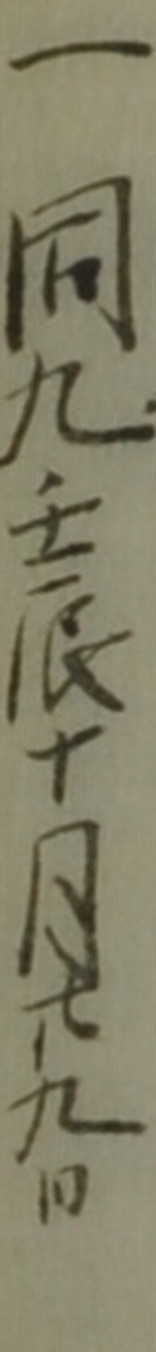一同九壬辰十月廿九日
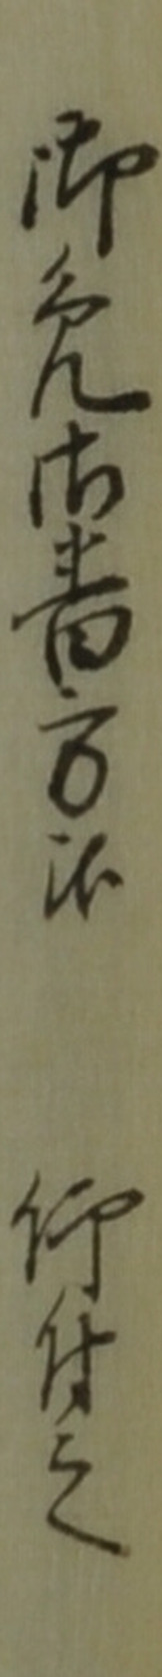御免御番方被仰付之
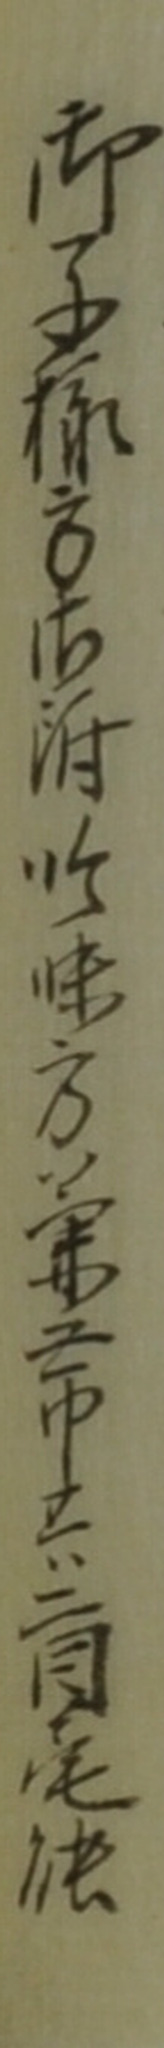御子様方御附吟味方兼帯共首尾能
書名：諸御役代々録（八）
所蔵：伊那市立高遠町図書館・合同会社AMANE
